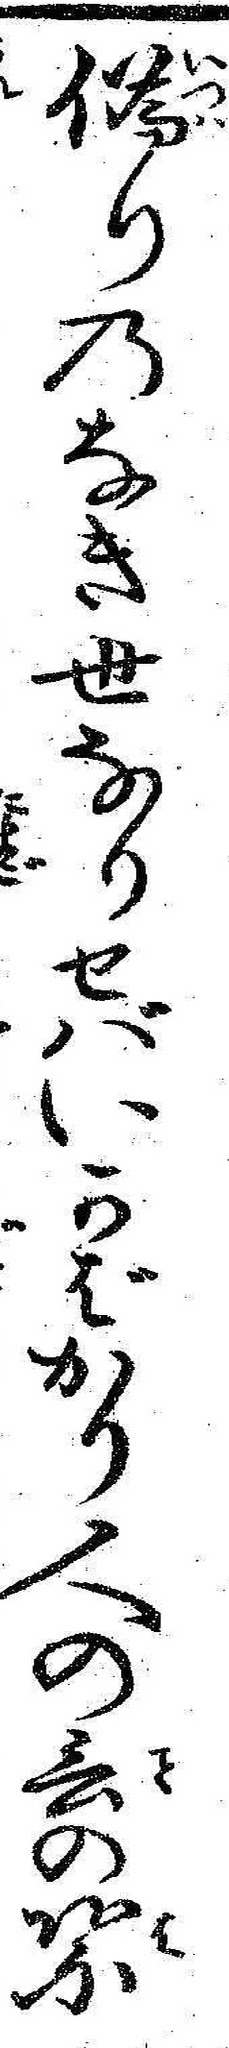偽りのなき世なりせばいかばかり人の言の葉
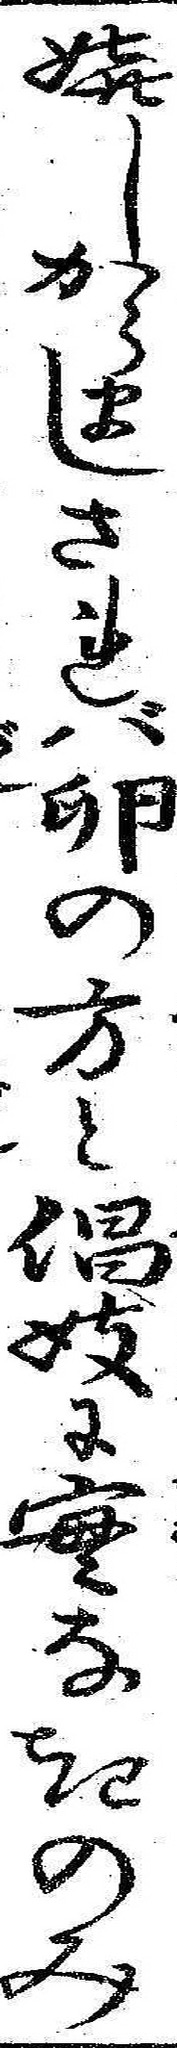嬉しからましされば卵の方と娼妓に實なきのみ
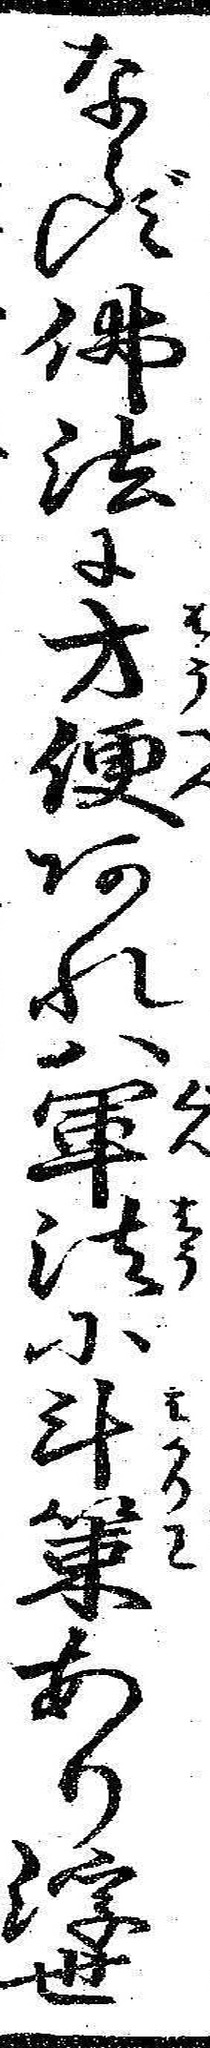ならず仏法に方便あれは軍法に計策あり浮世
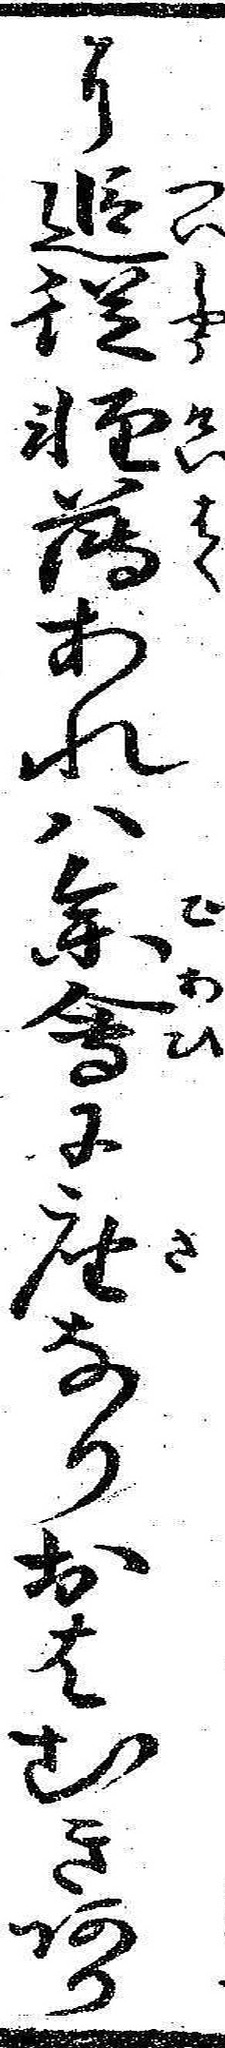に追従軽薄あれは参会に座なりおはむきあり
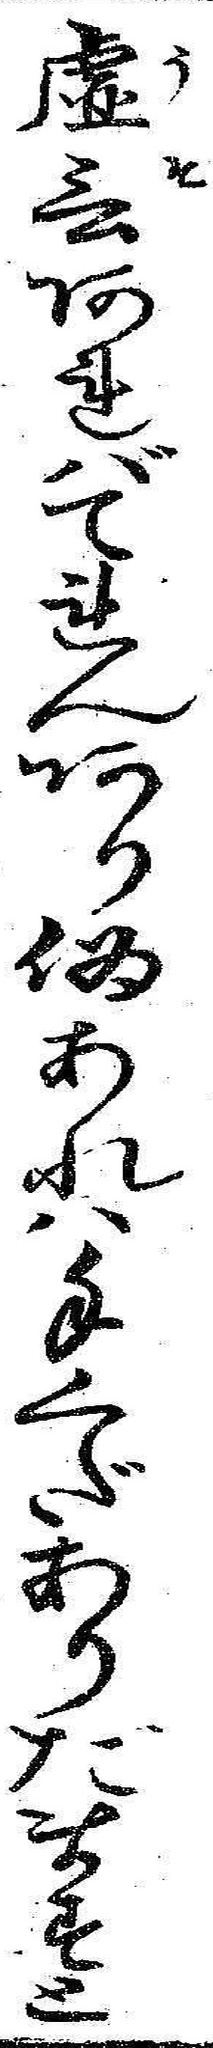虚言あればてれんあり偽あれは手くだありだますと
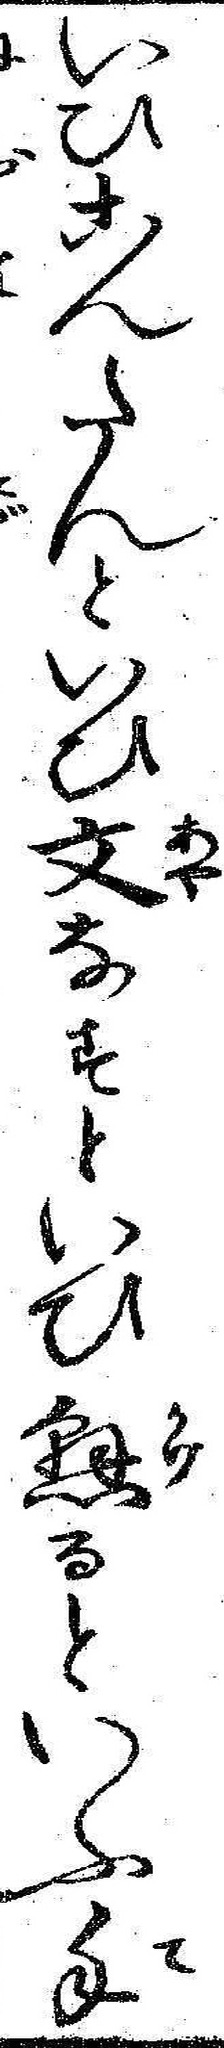いひこんたんといひ文なすといひ懸るといふ手
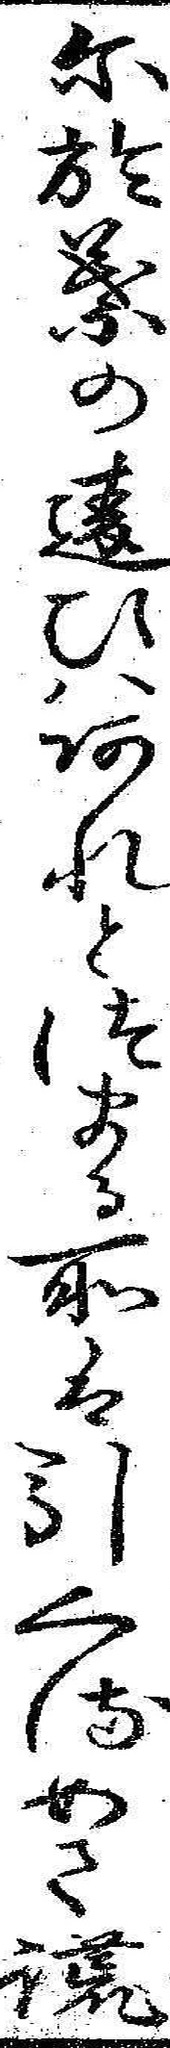尓於葉の違ひはあれとつまる所は引くるめて謊
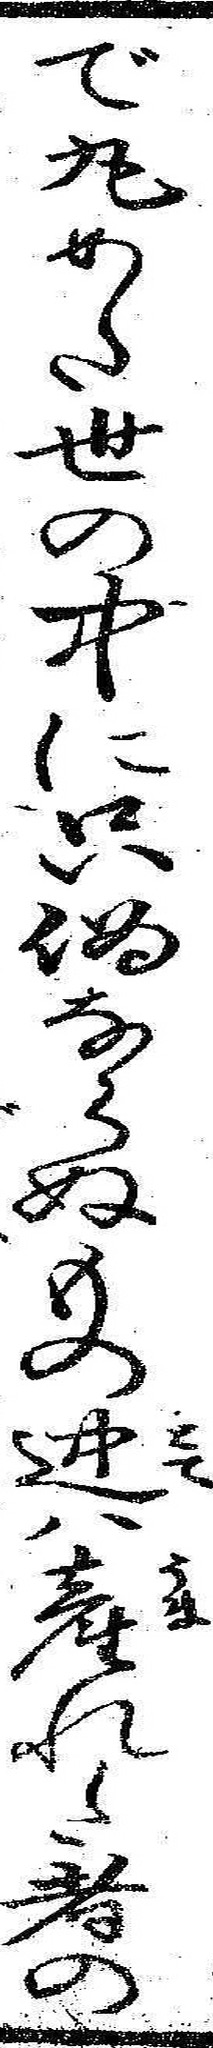で丸めた世の中に只偽ならぬもの迚は産れた者の
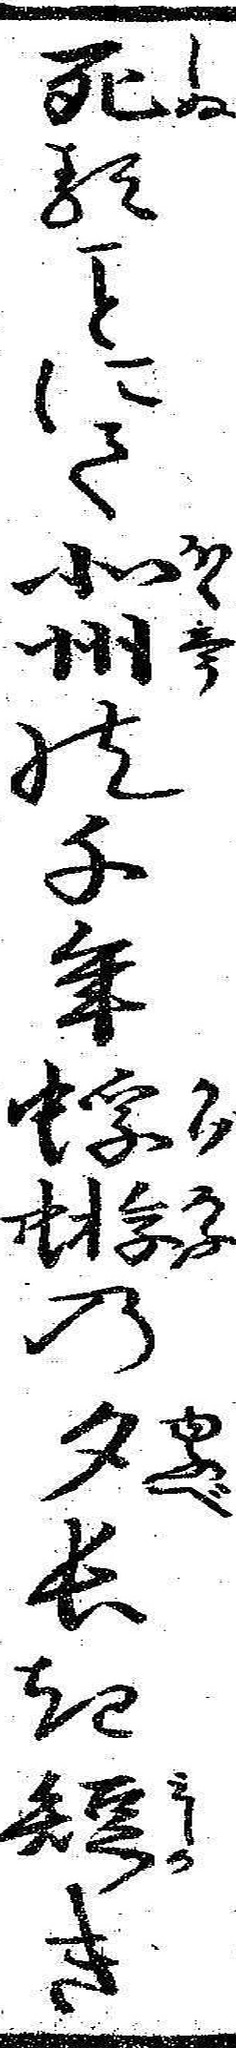死ることにて北州の千年蜉蝣の夕長き短き

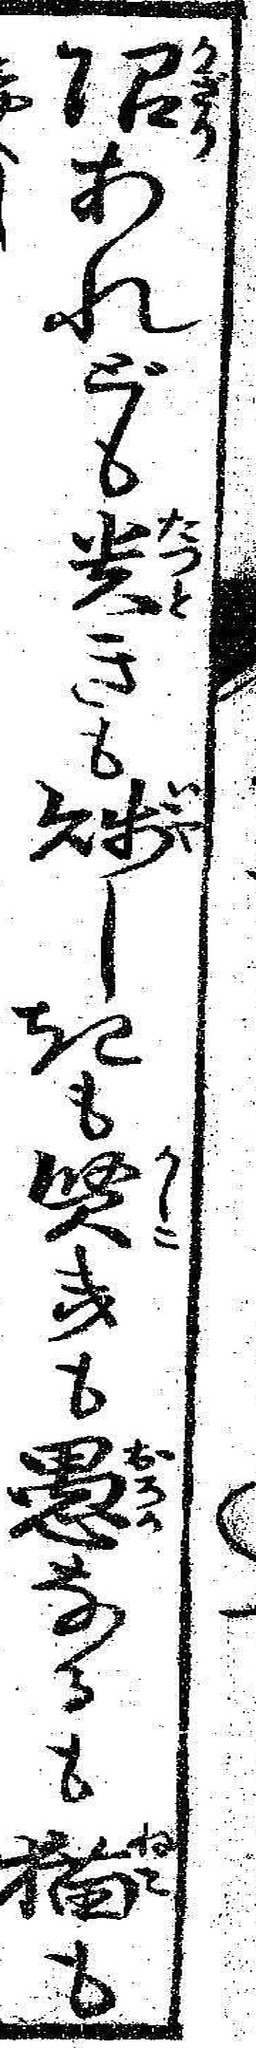限あれども貴きも賎しきも賢きも愚なるも猫も
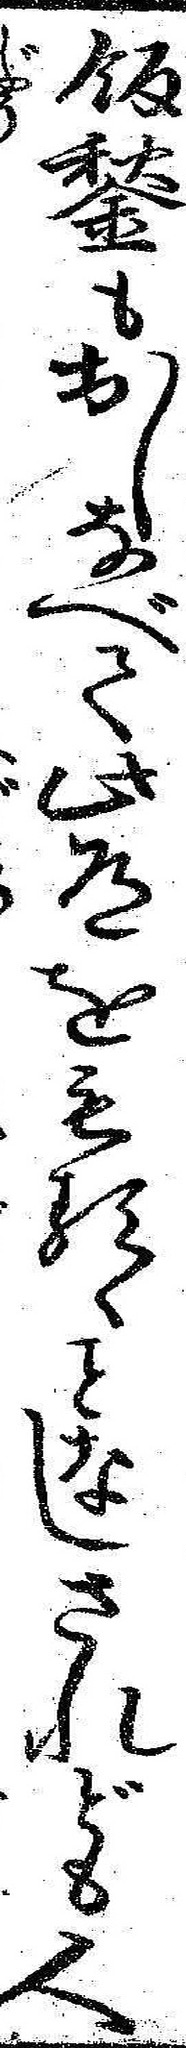飯鍬もおしなべて此道をもるゝことなしされども人
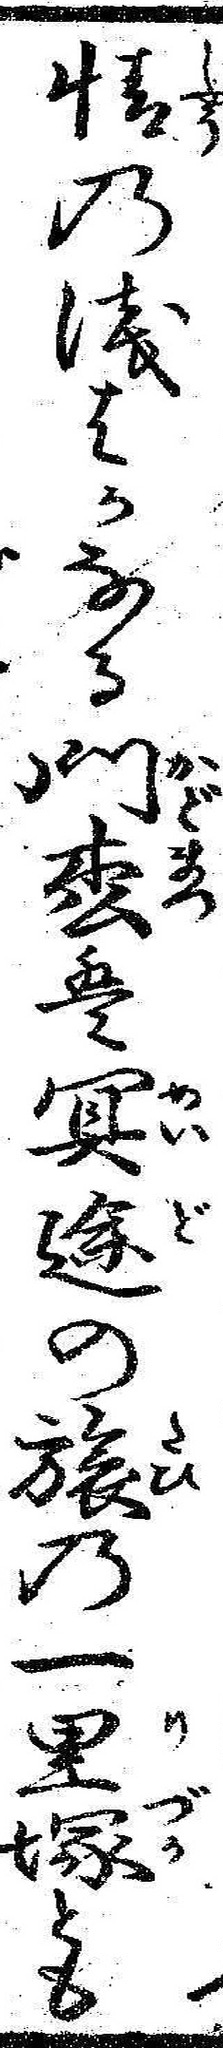情の浅はかなる門松は冥途の旅の一里塚とも
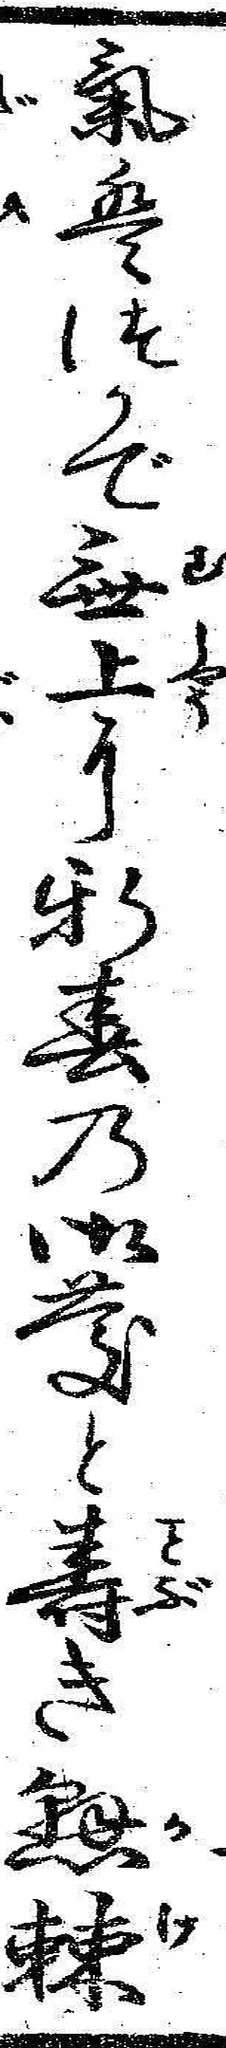気はつかで無上に新春の御慶と寿き懸棘
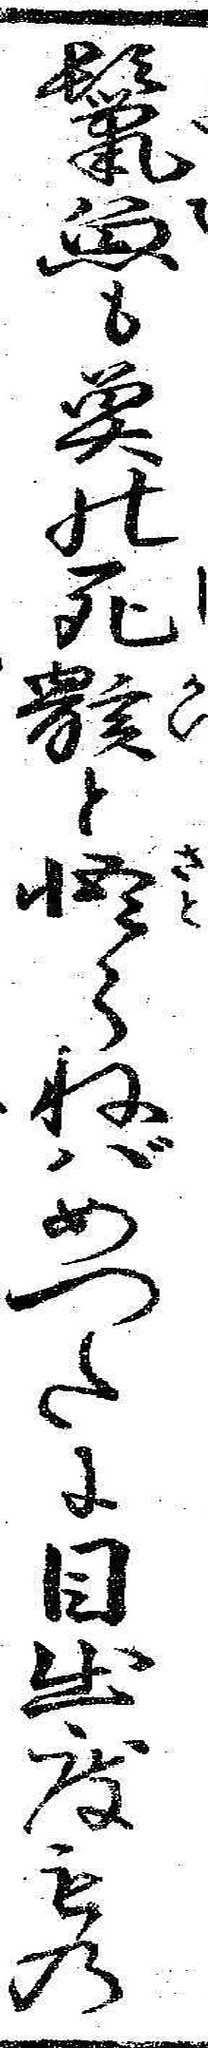鼈魚も魚の死骸と悟らねばめつたに目出度もの
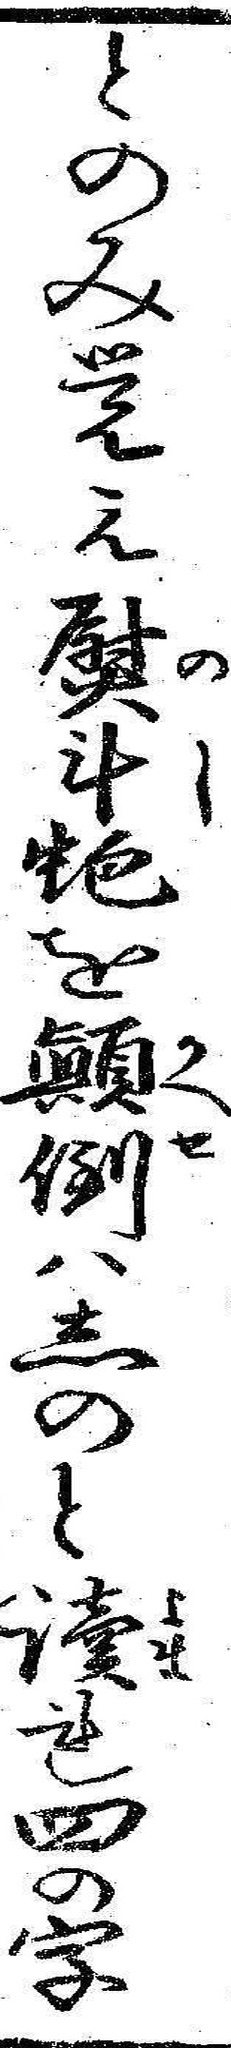とのみ覚え熨斗蚫を顛倒はしのと読れ四の字
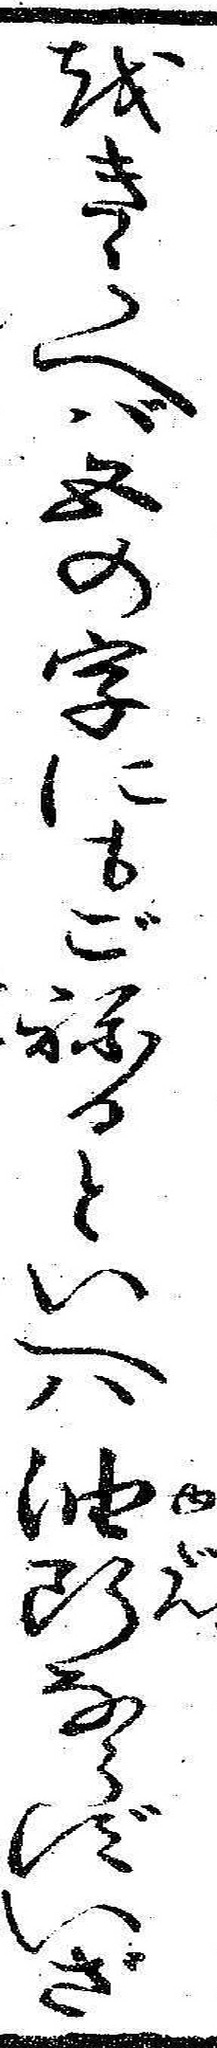をきらへば五の字にもごねるといへは油断ならずいざ
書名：根無草後編
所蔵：国文学研究資料館
